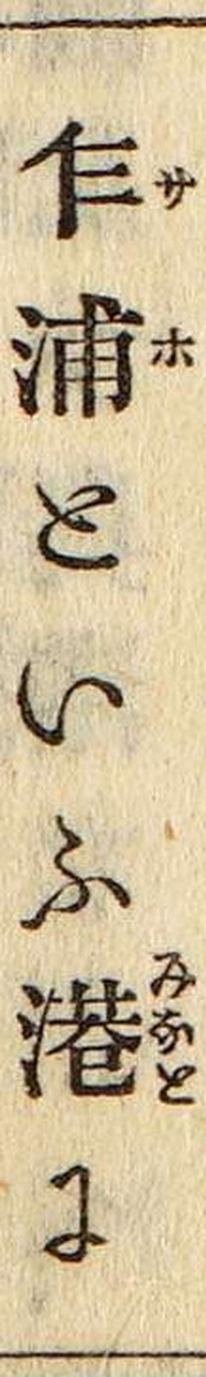乍浦といふ港

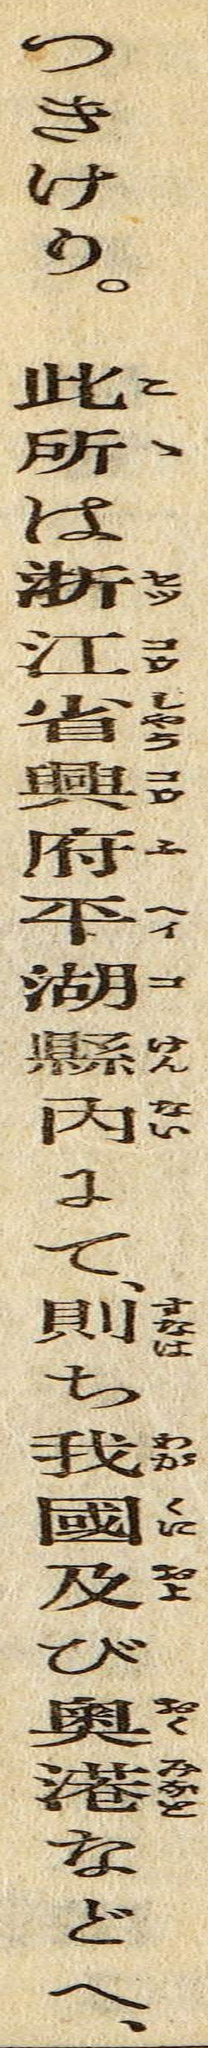つきけり。此所は浙江省興府平湖県内にて則ち我国及び奥港などへ、
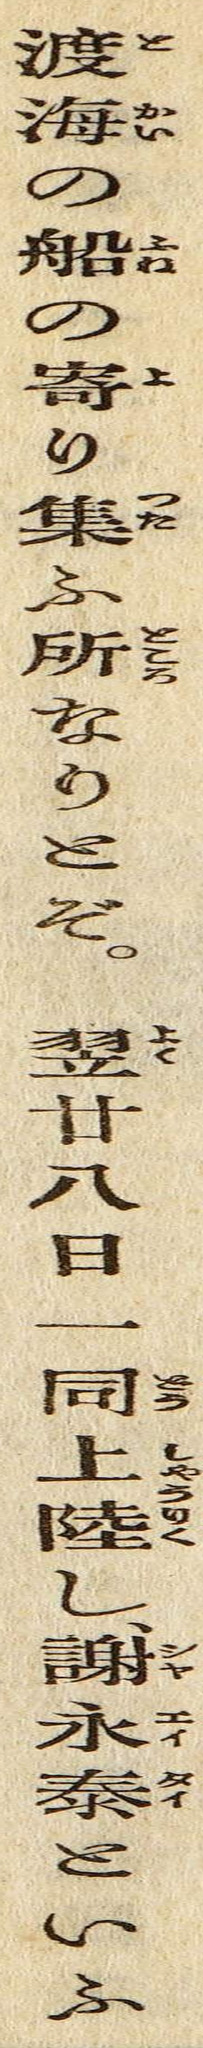渡海の船の寄り集う所なりとぞ。翌廿八日一同上陸し謝永泰といふ
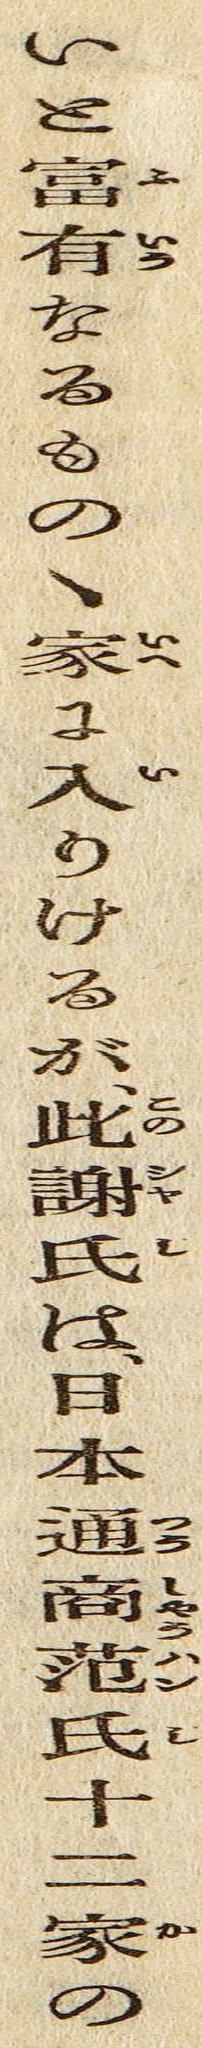いと富有なるものゝ家に入りけるが、此謝氏は、日本通商范氏十二家の
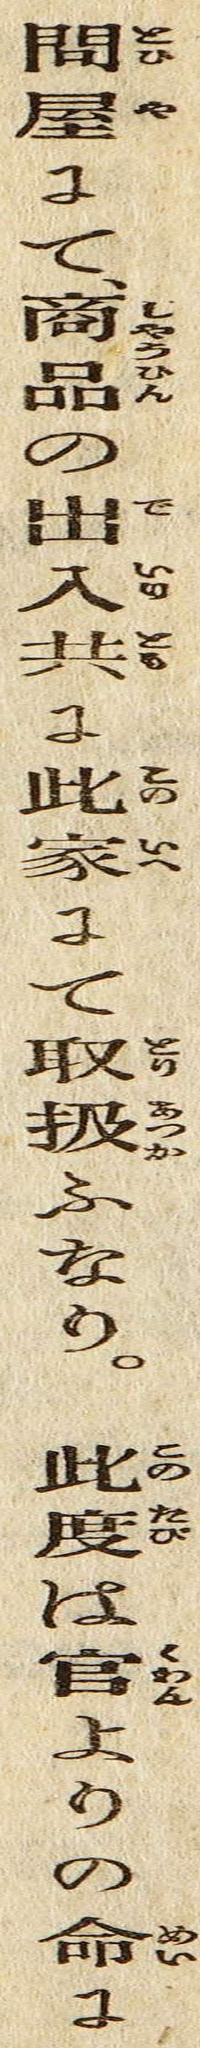問屋にて商品の出入共に此家にて取扱ふなり。此度は官よりの命に
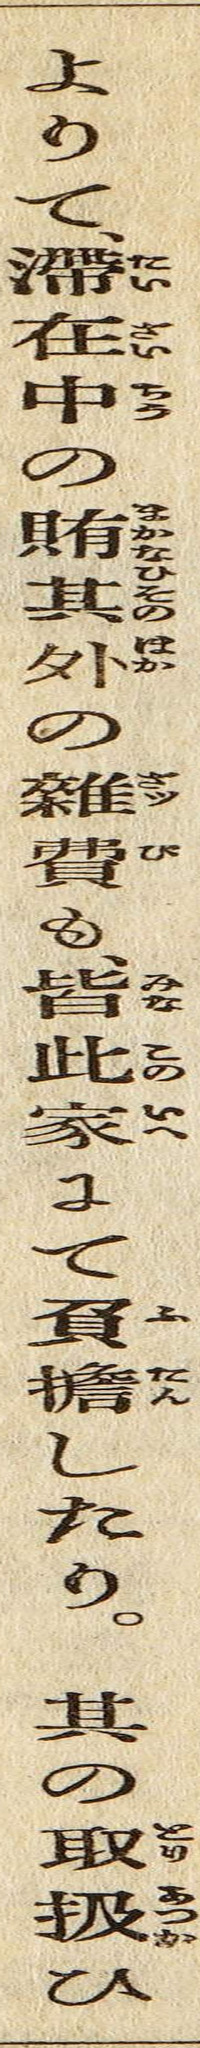よりて滞在中の賄其外の雑費も、皆此家にて負担したり。其の取扱ひ
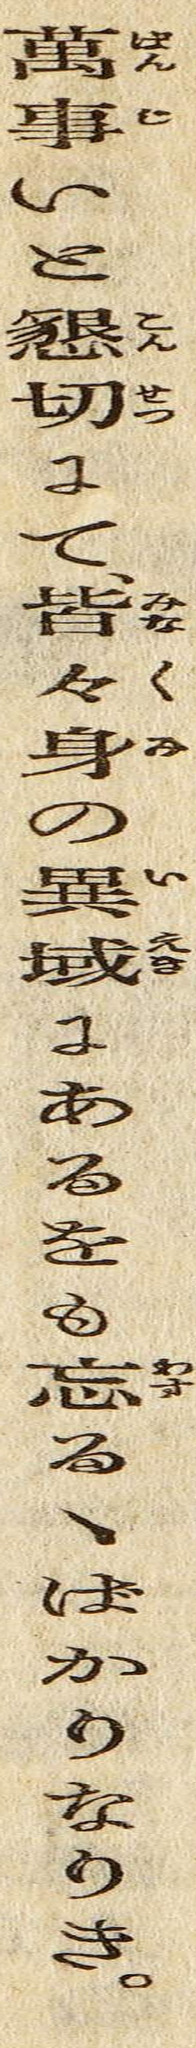萬事いと懇切にて皆々身の異域にあるをも忘るゝばかりなりき。
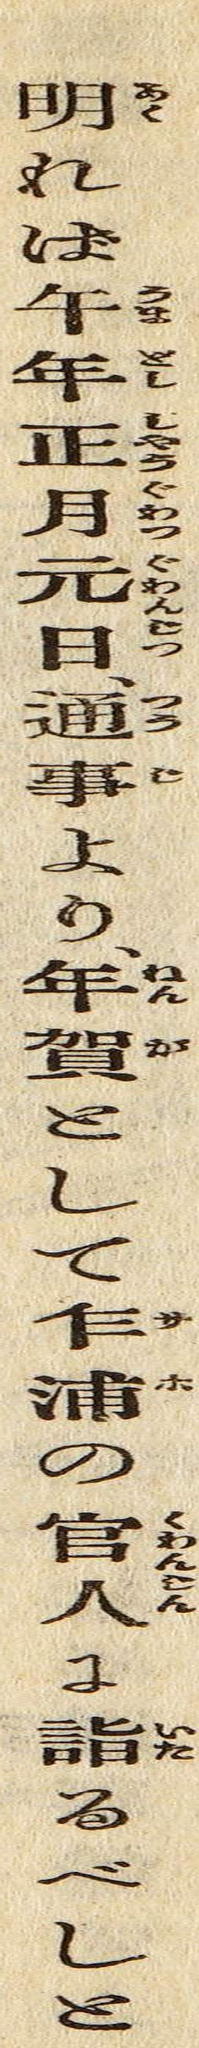明れば午年正月元日通事より年賀として乍浦の官人に詣るべしと
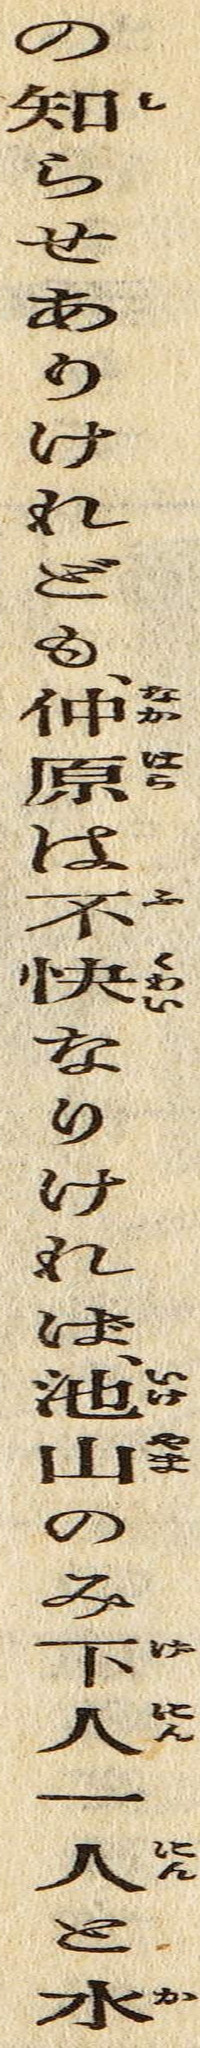の知らせありけれども仲原は不快なりければ、池山のみ下人一人と水
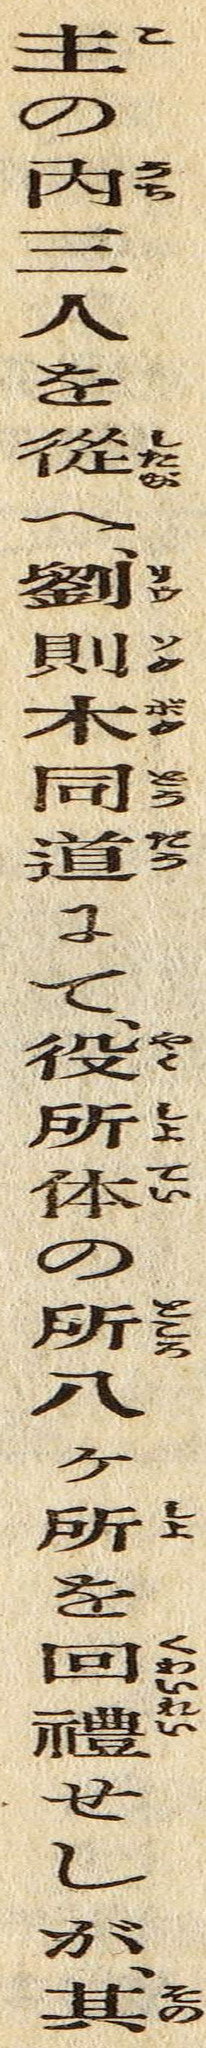主の内三人を従へ劉則木同道にて役所体の所八ケ所を回礼せしが、其
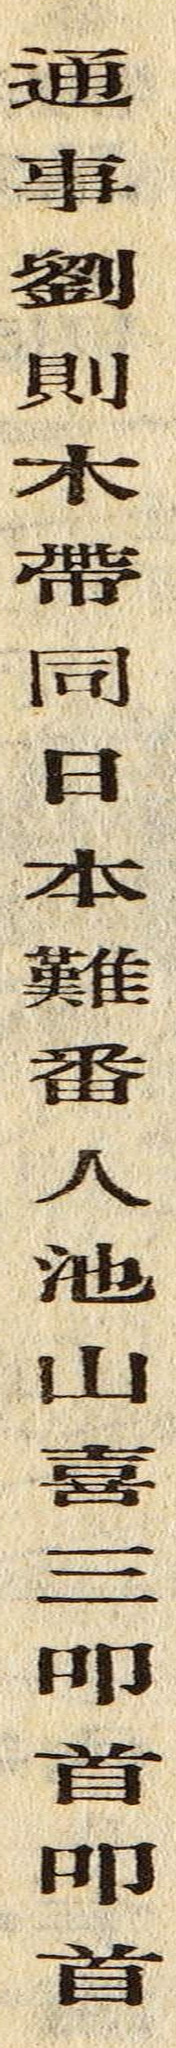通事劉則木帯同日本難番人池山喜三叩首叩首
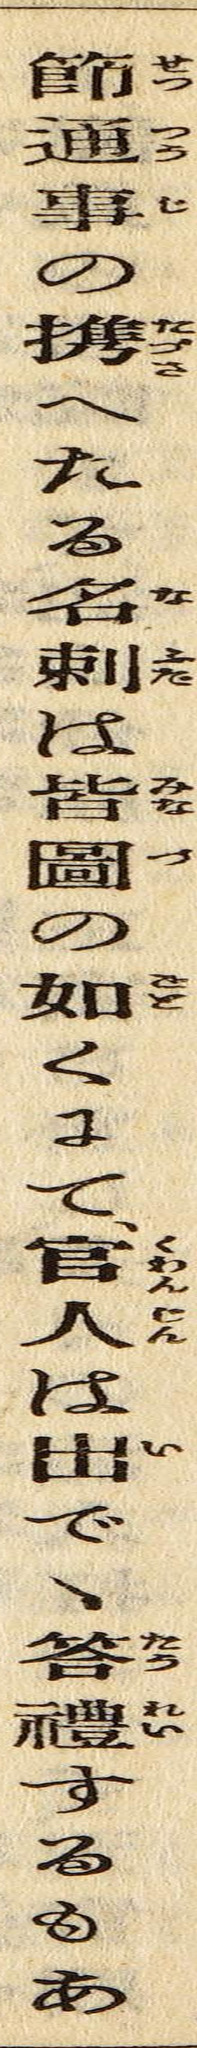節通事の携へたる名刺は皆図の如くにて官人は出でゝ答礼するもあ
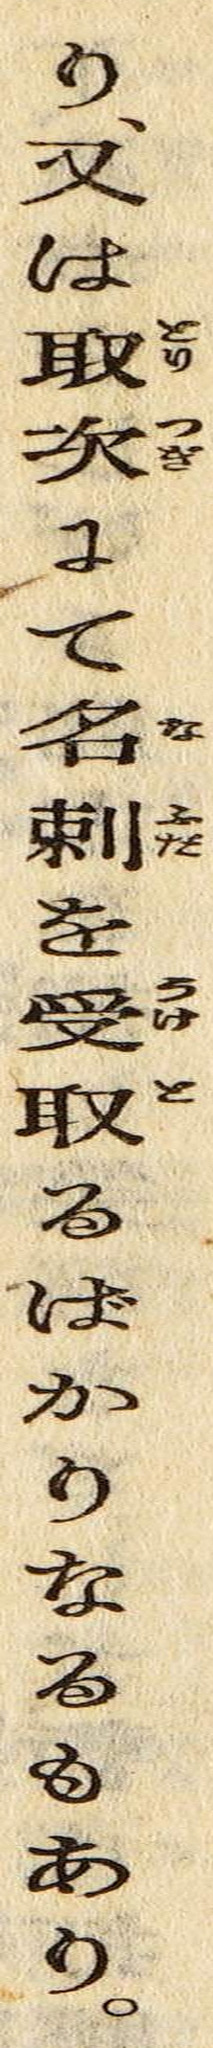り、又は取次にて名刺を受取るばかりなるもあり。
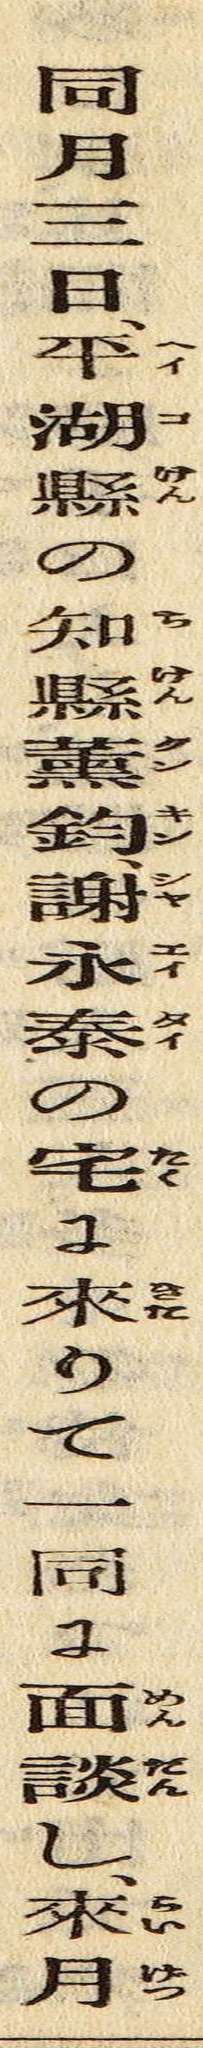同月三日平湖県の知県薫鈞、謝永泰の宅に来りて一同に面談し来月
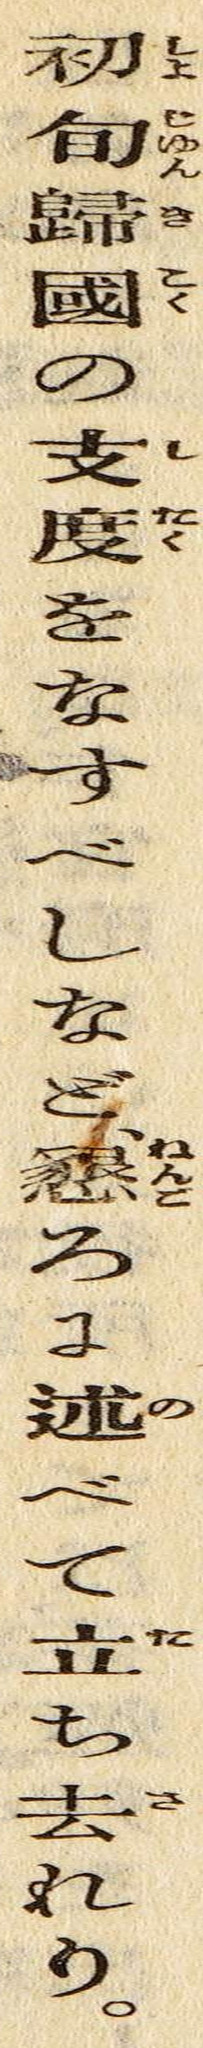初旬帰国の支度をなすべしなど懇ろに述べて立ち去れり。
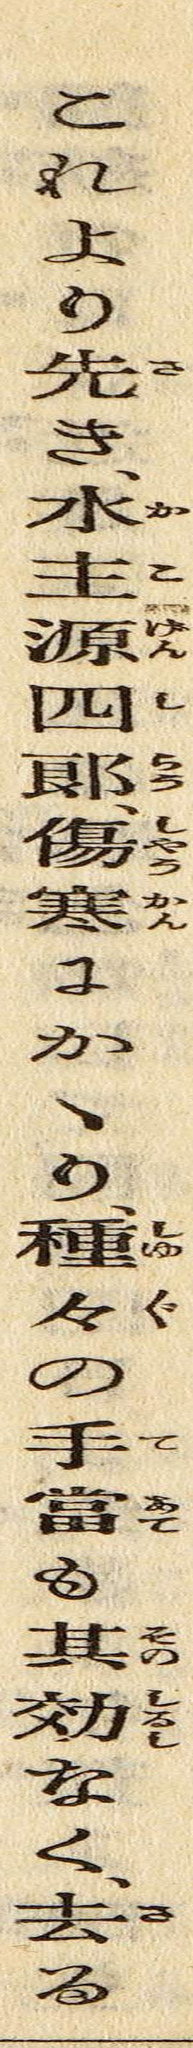これより先き、水主源四郎傷寒にかゝり種々の手当も其効なく去る
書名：日本漂流譚
